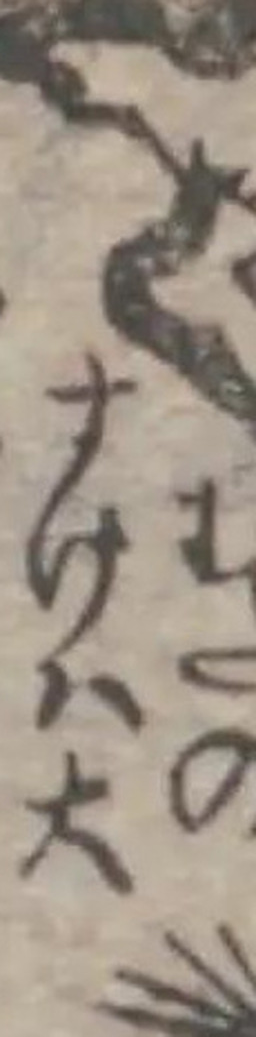すけは大
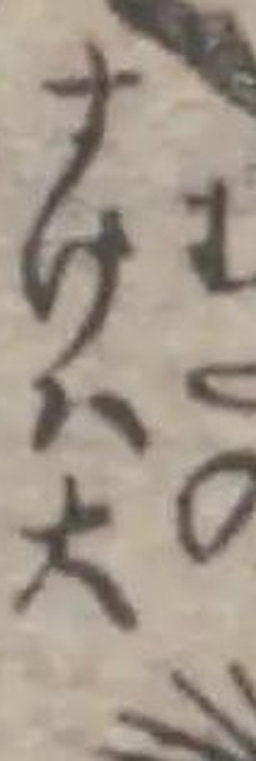すけは大
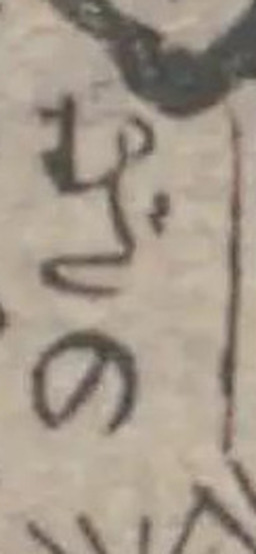むだの
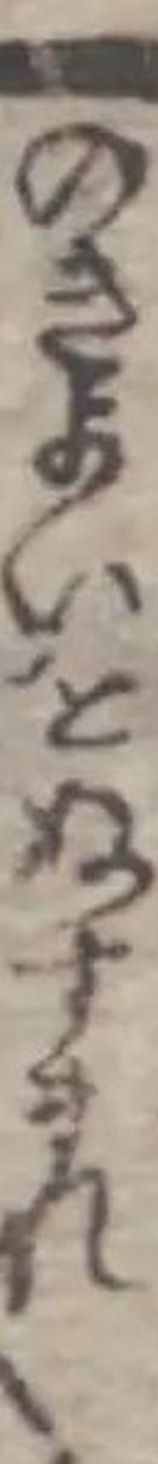のきよいをぬすまれ
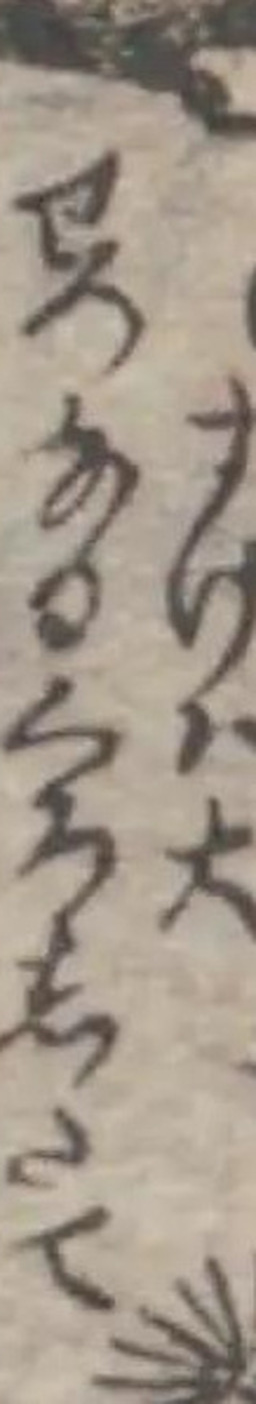せつなるくろしたて
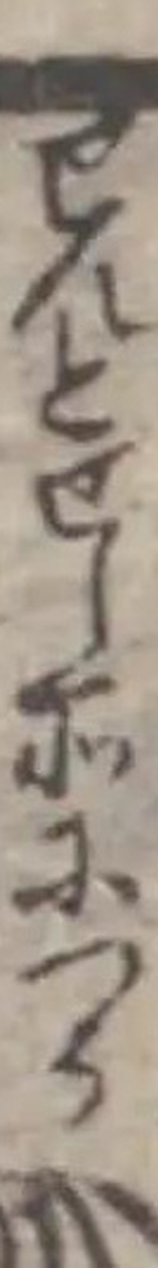せんとせし所につう
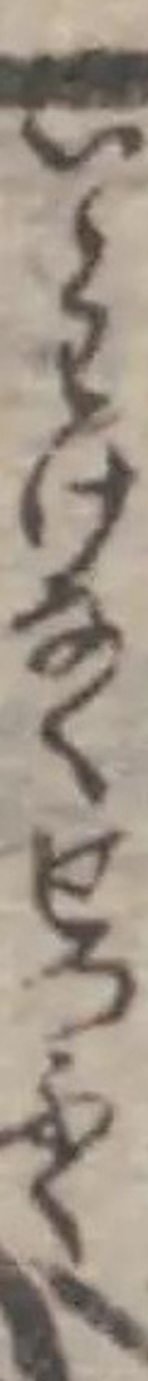いゝわけなくせつふく
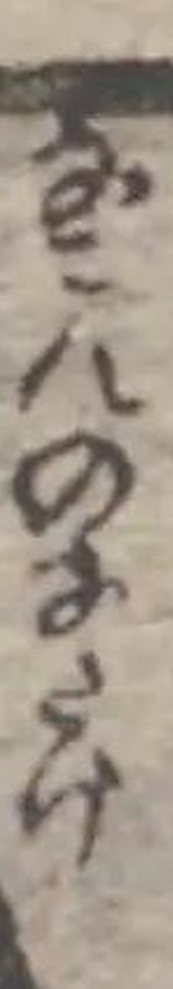なこんのなさけ
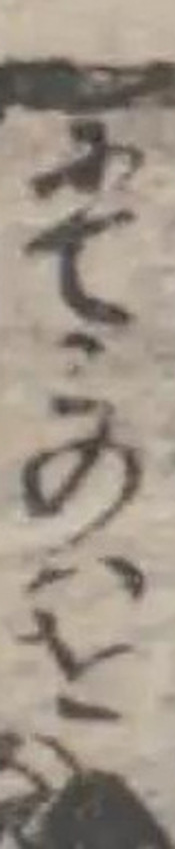にてこのはを
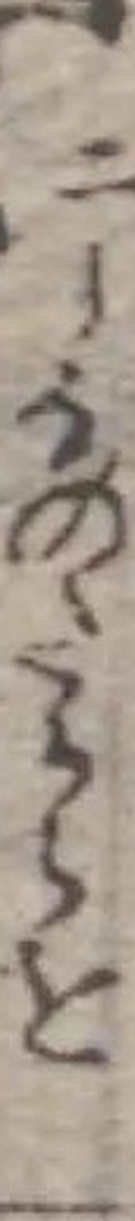二しなのたからを
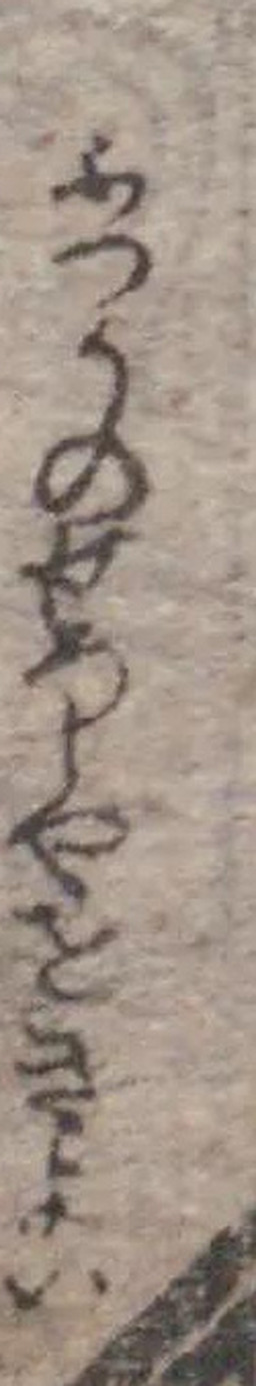ふつうのせつしやをきよい
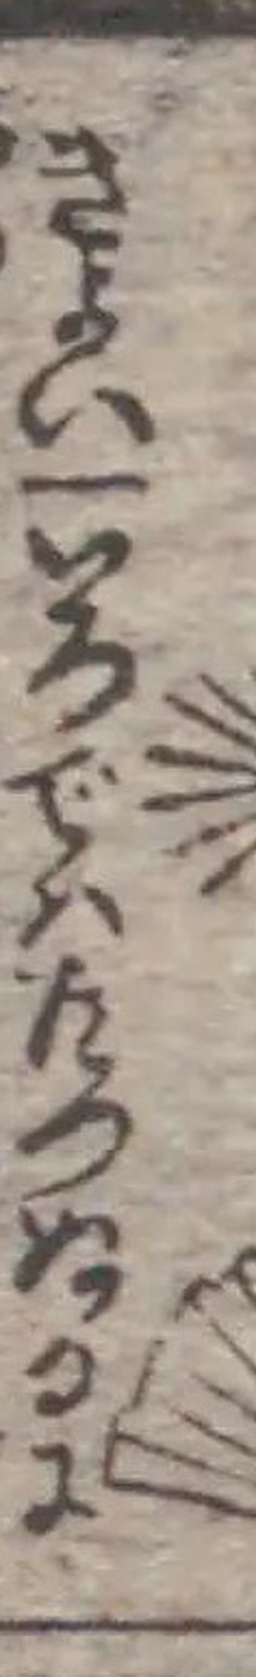きよい一いろではたつぬるに
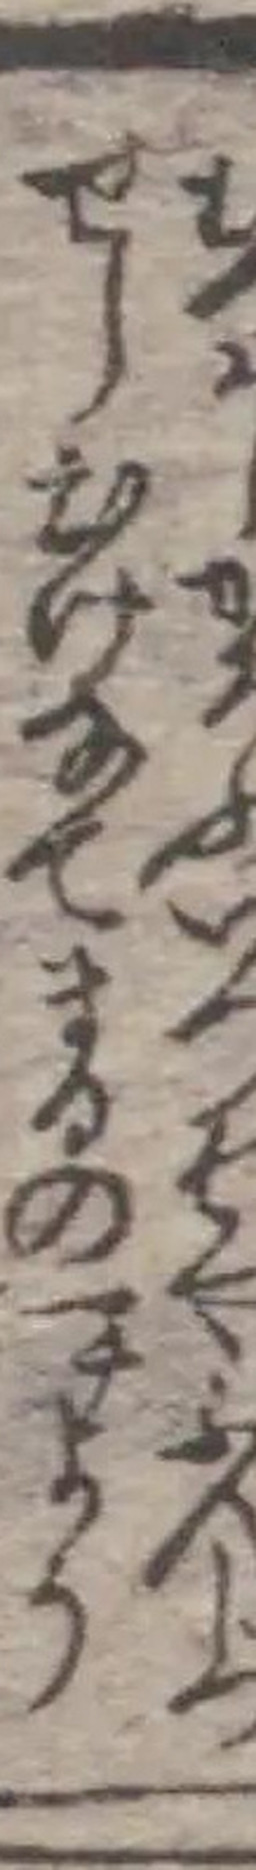せしひけなてまるの一チよう
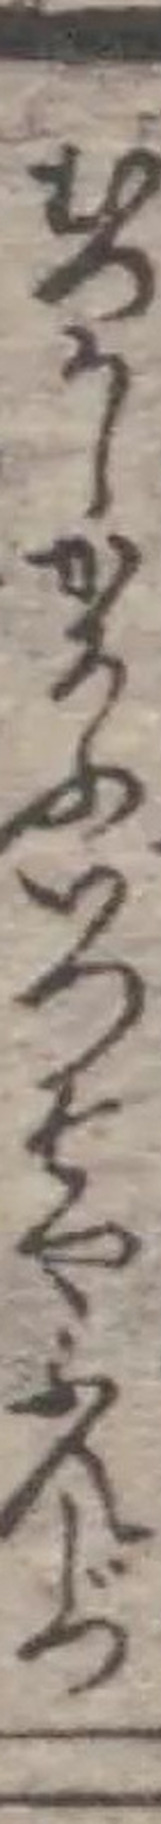むつかしかろふいつそやふんじつ
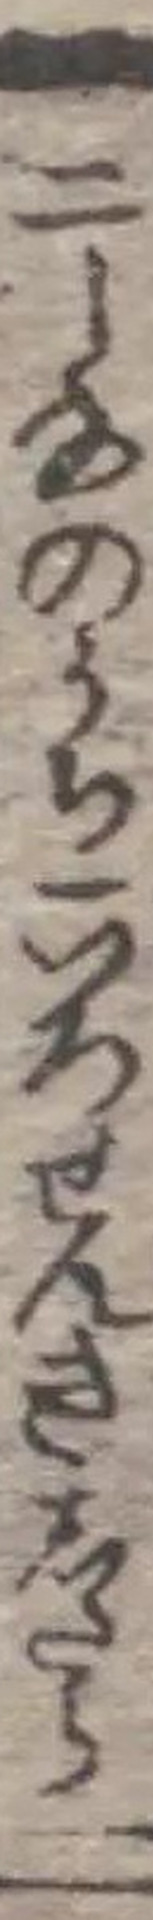二しなのうち一いろせんきしたら
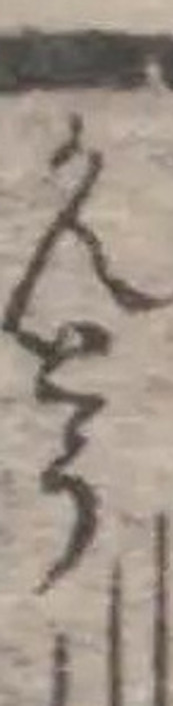かんとう
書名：富多高慢噺 3巻
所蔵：国立国会図書館 National Diet Library, JAPAN
